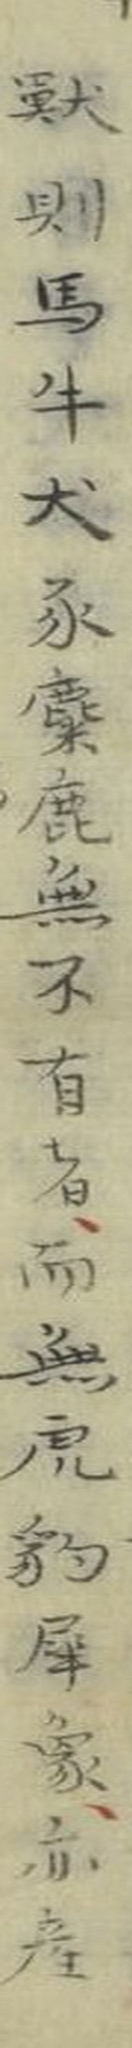獣則馬牛犬豕麋鹿無不有者、而虎豹犀象、亦産
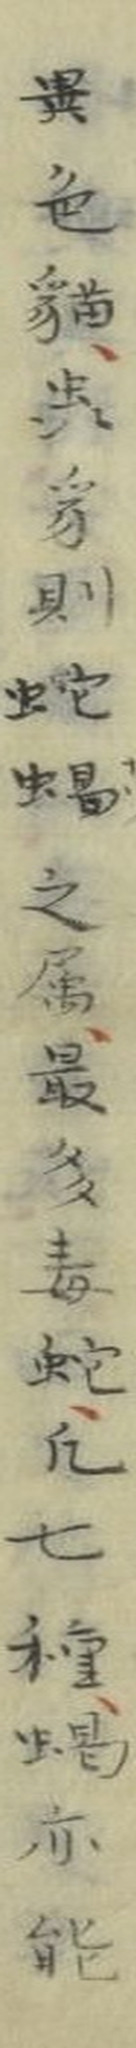異色貓、蟲豸則蛇蝎之属、最多毒蛇、凡七種、蝎亦能
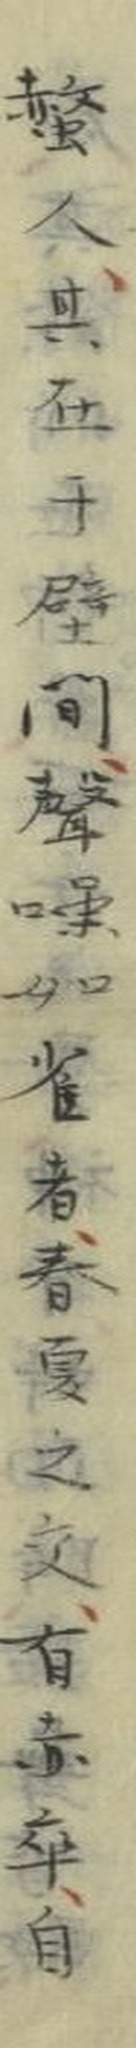螫人、其在于壁間、声噪如雀者、春夏之交、有赤卒、自
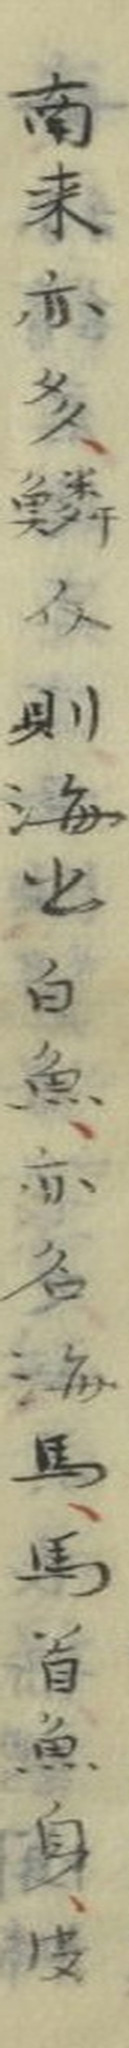南来亦多鱗介則海出？白魚、亦名海馬、馬首魚身、皮
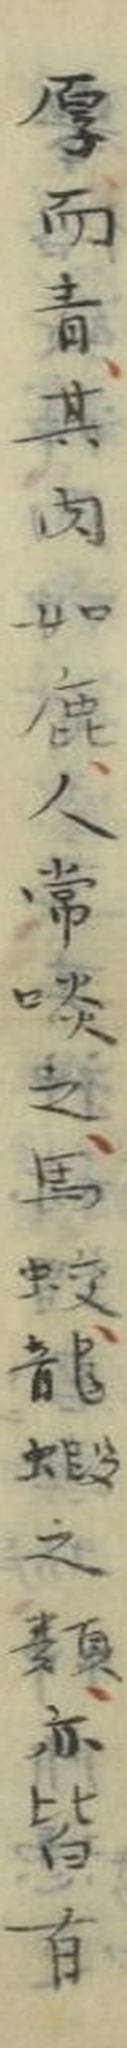厚而青、其肉如鹿、人常啖之、馬蛟、龍蝦之類、亦皆有
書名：琉球
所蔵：University of the Ryukyus Library
